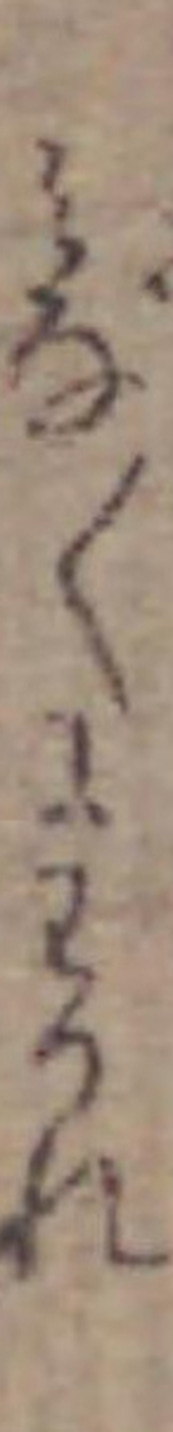みな〳〵にわかれ
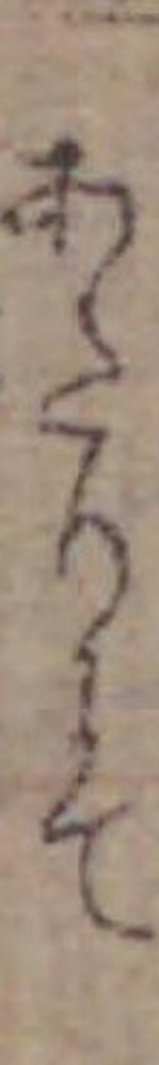あたりにて
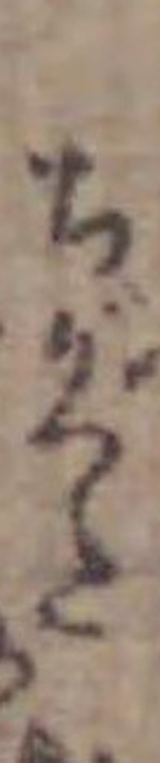ちがつたか
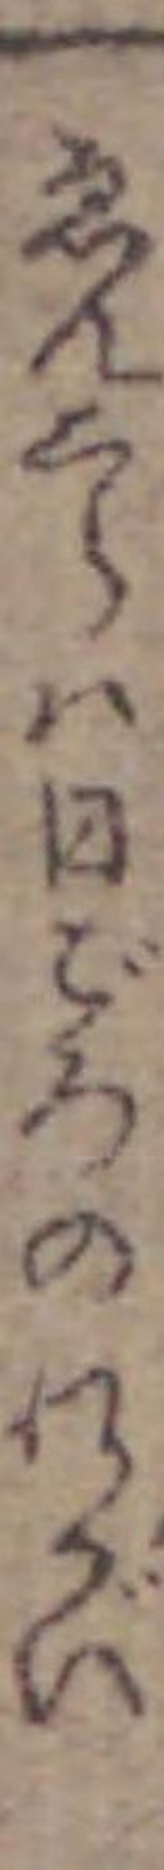ゑん二郎は日ごろのねがい
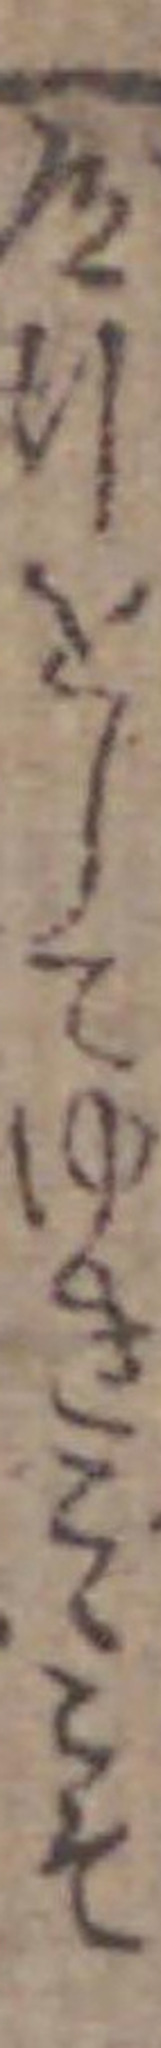道行をしてゆきこゝこそ
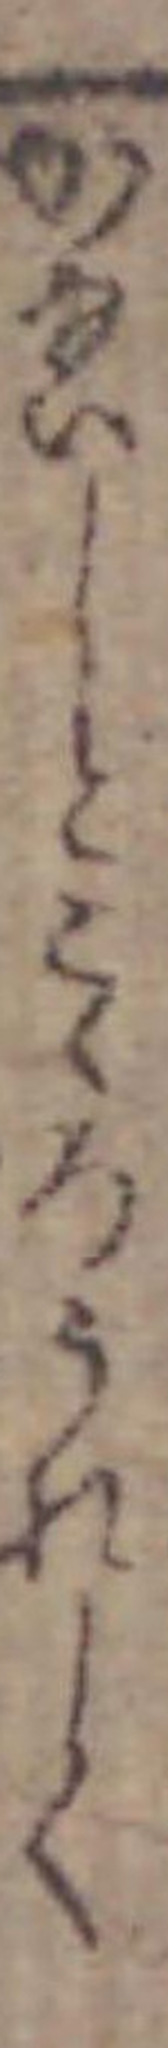かないしとこゝろうれしく
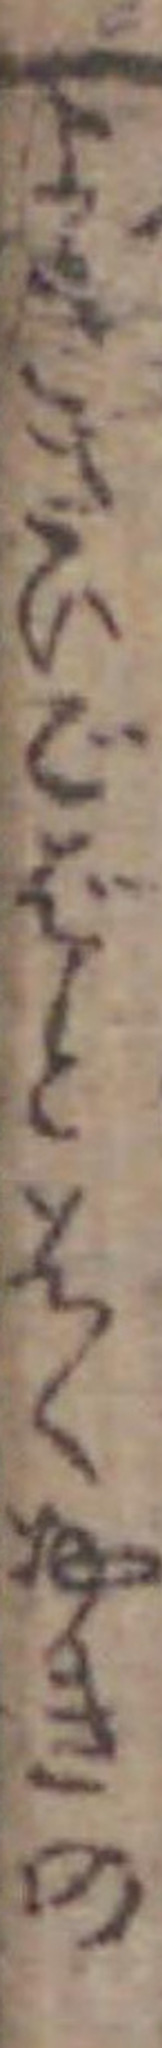よきさいごばとはくおきの
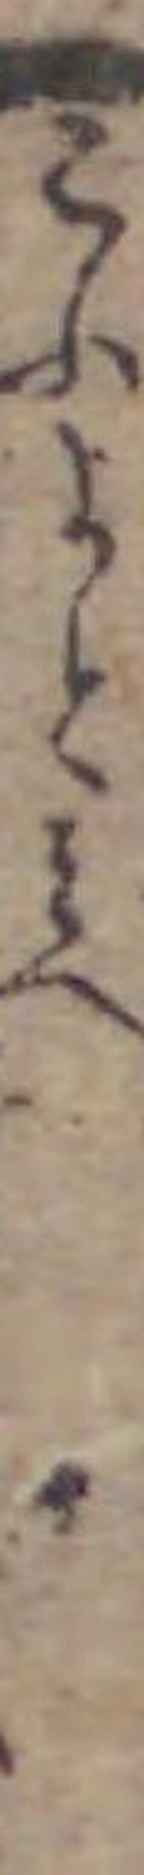こふよとみへ
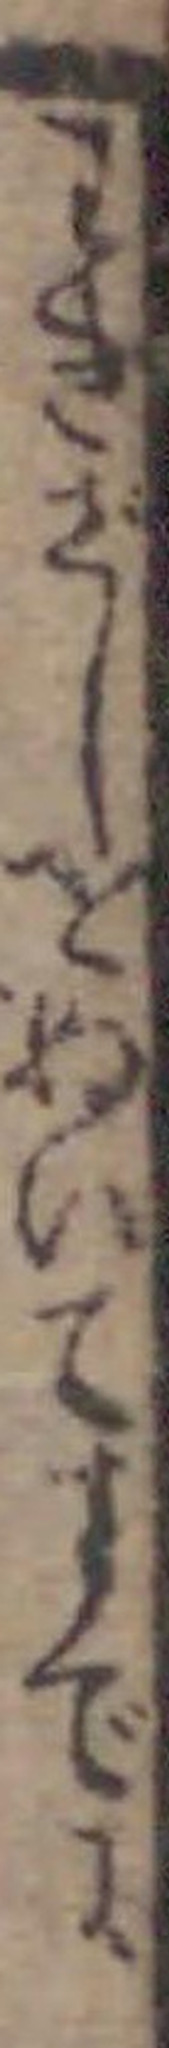わきざしをぬいてすでに
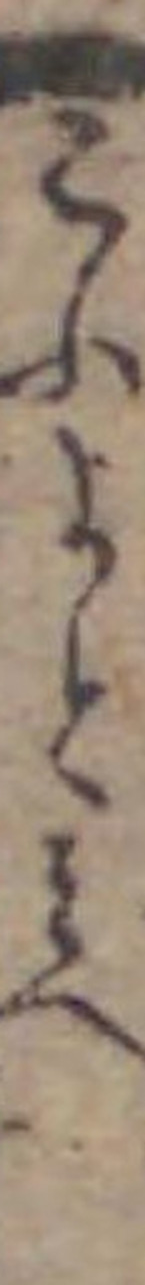こふよとみへ
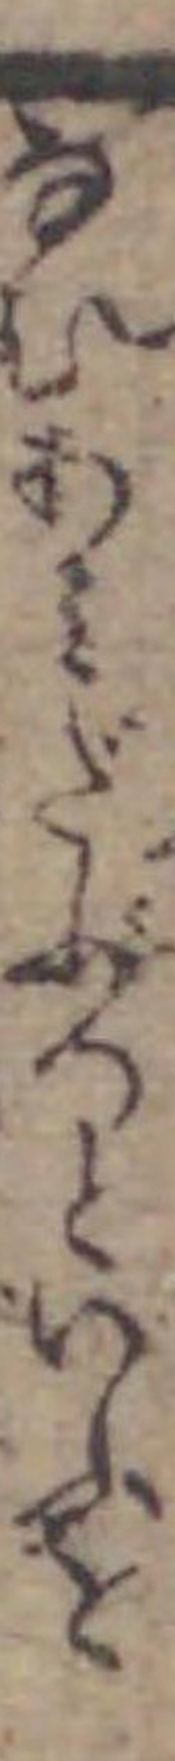なむあみだぶつといふを
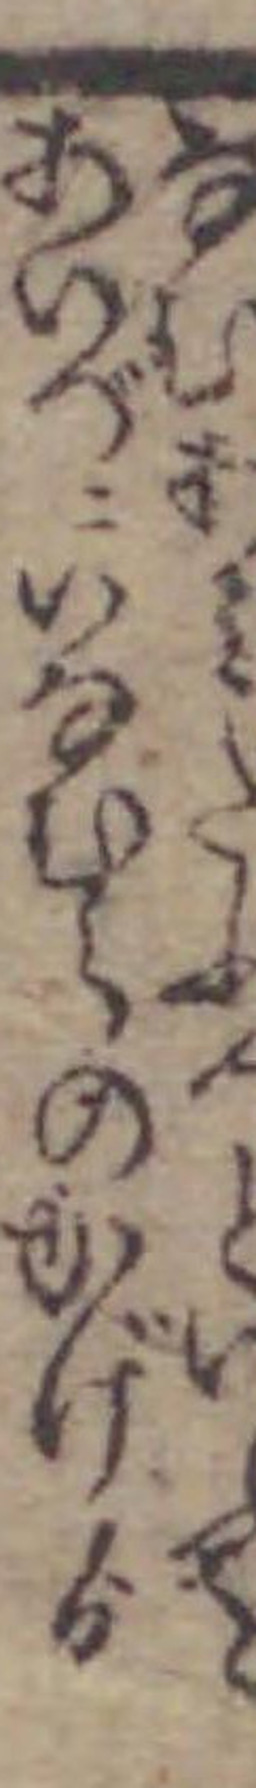あいづにいなむらのかげより
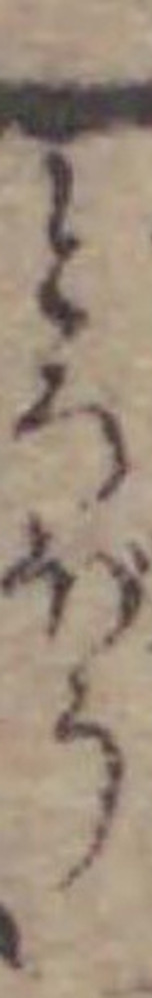とろぼう
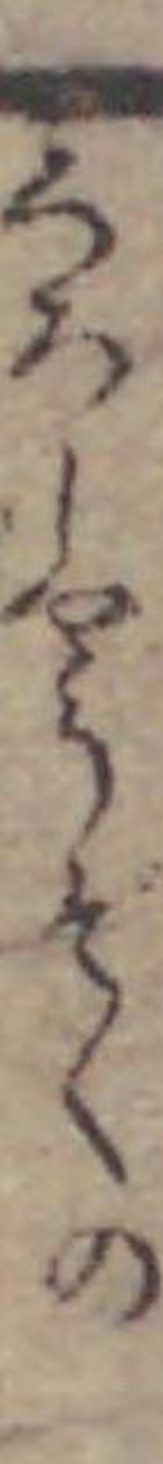くろしやうぞくの
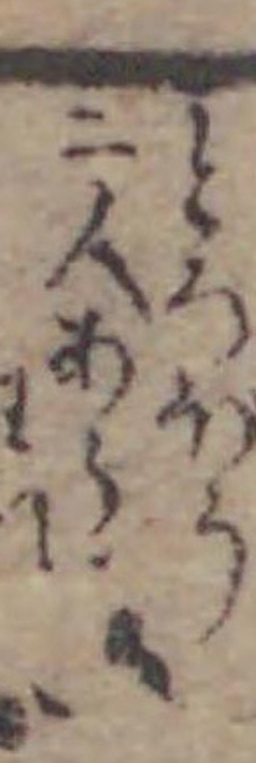二人あら
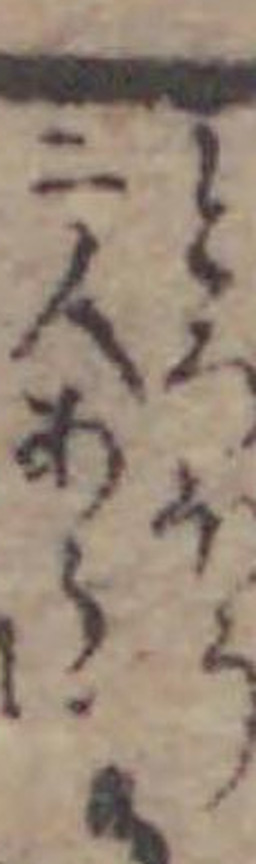二人あら
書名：江戸生艶気樺焼 : 3巻
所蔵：国立国会図書館 National Diet Library, JAPAN
